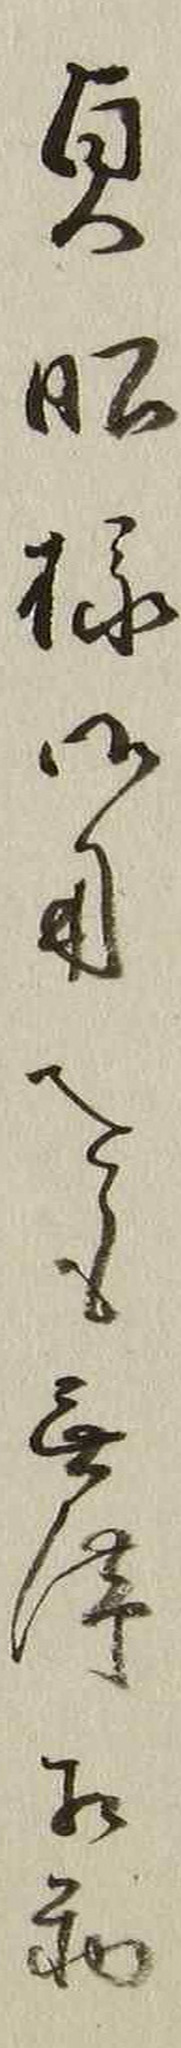貞昭様御用をも無滞相勤
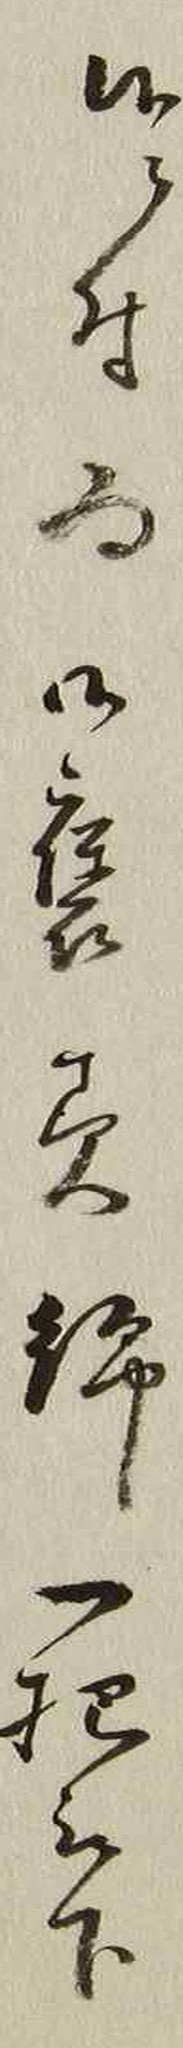候に付為御褒美綿一把被下
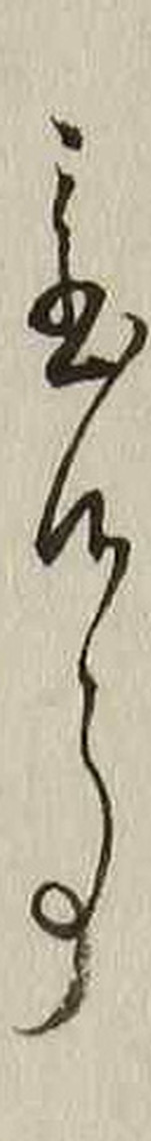置候事
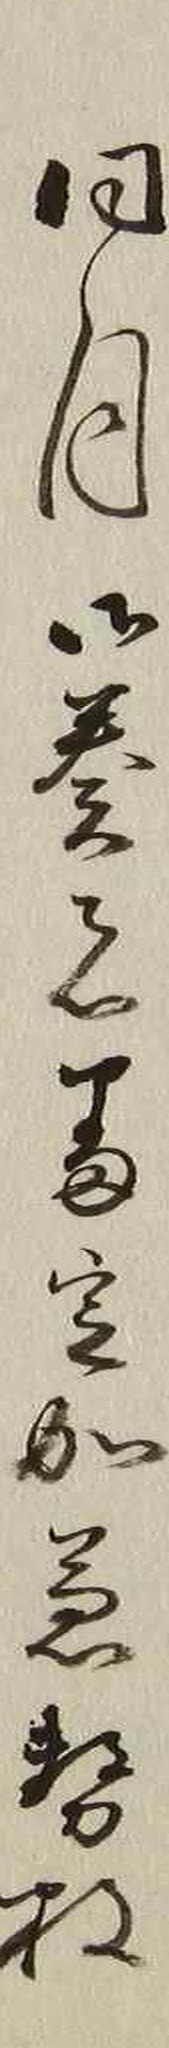一同月御奏者番定加兼務枚
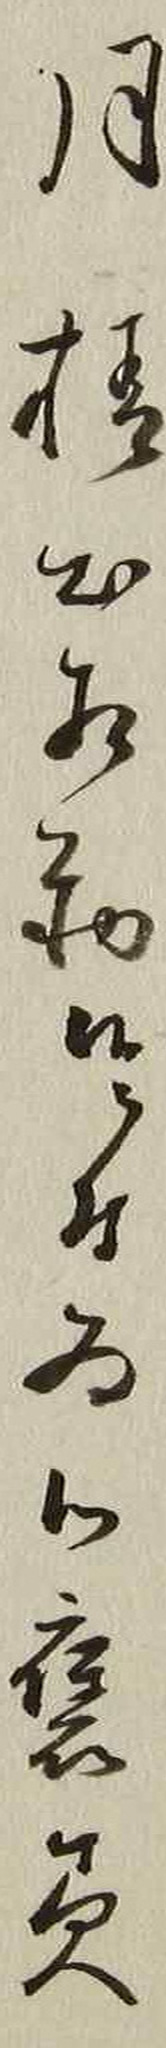月精出相勤候に付為御褒美
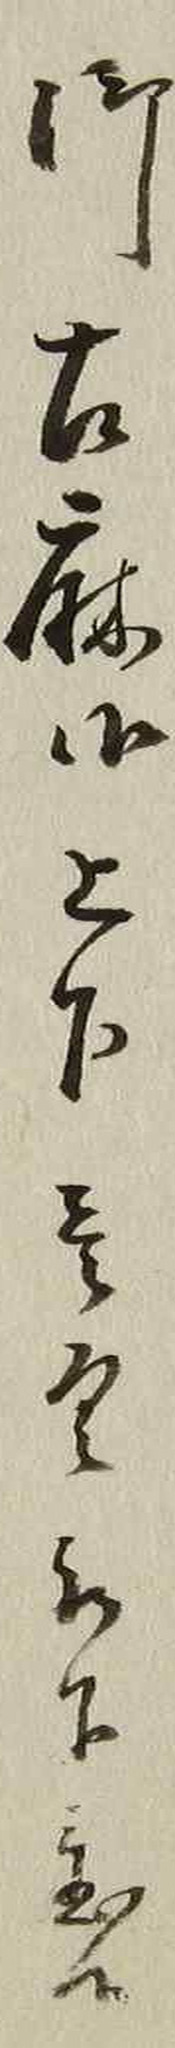御古麻御上下一具被下置候
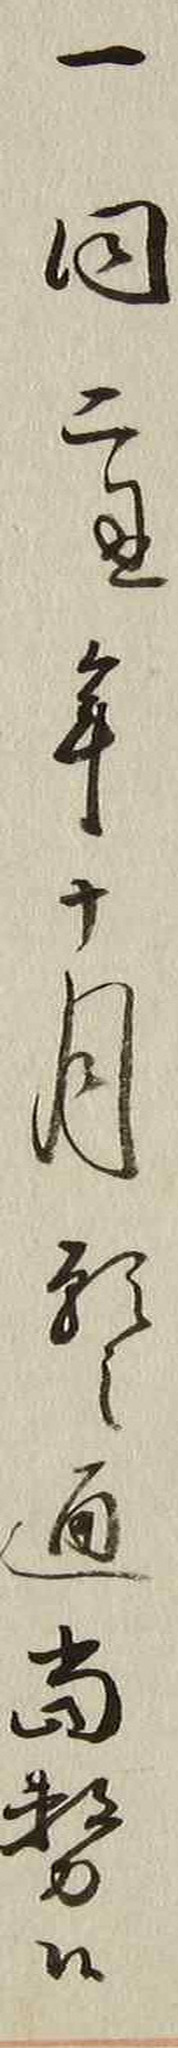一同二丑年十月願之通当務御
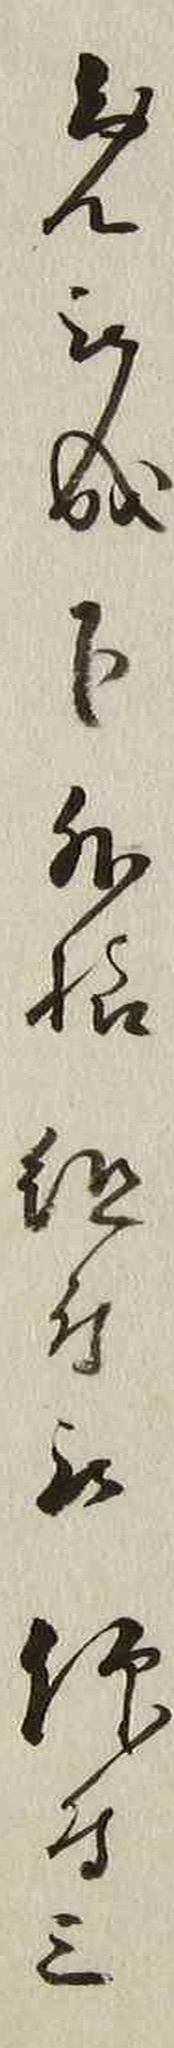免被成下外様組付被仰付三
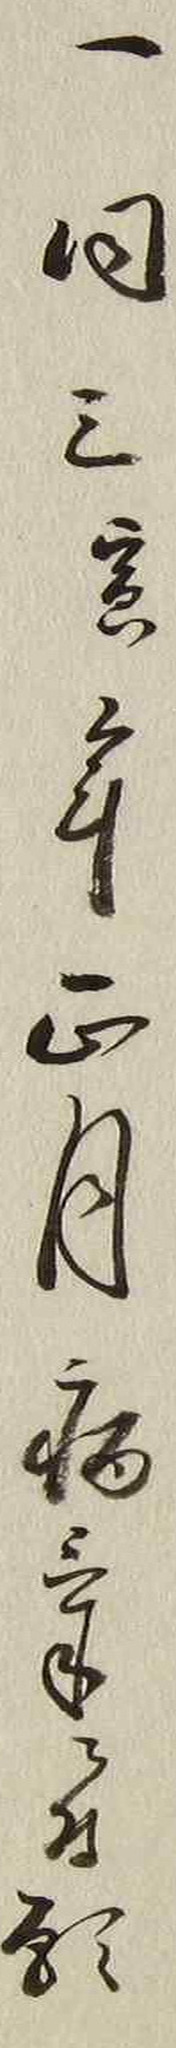一同三寅年正月病気に付願
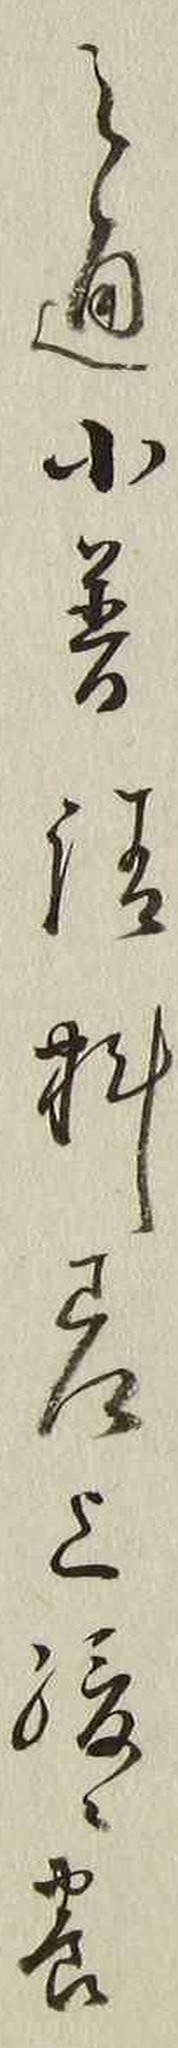之通小普請料差上緩々養
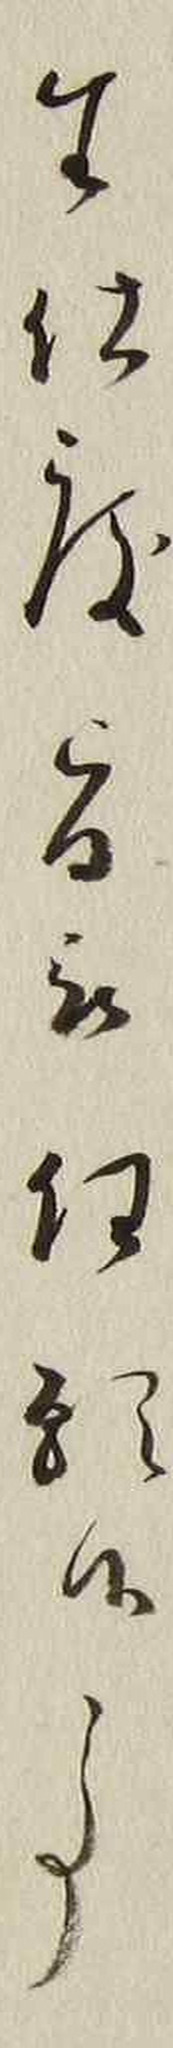生仕度旨被任願候事
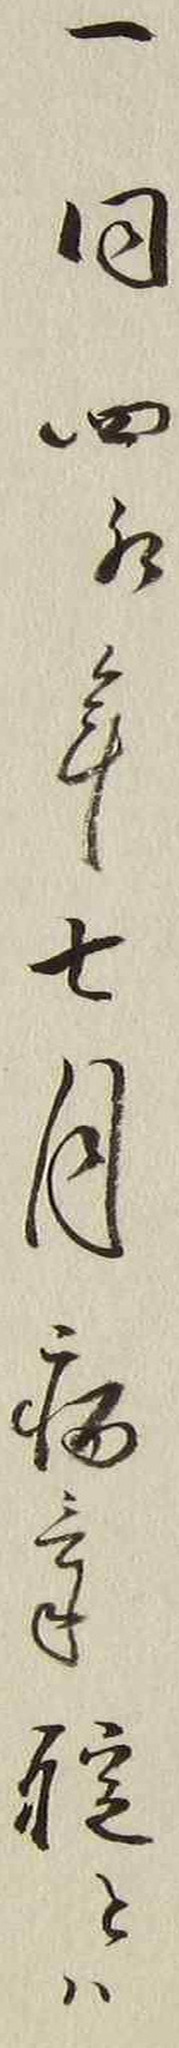一同四卯年七月病気聢とは
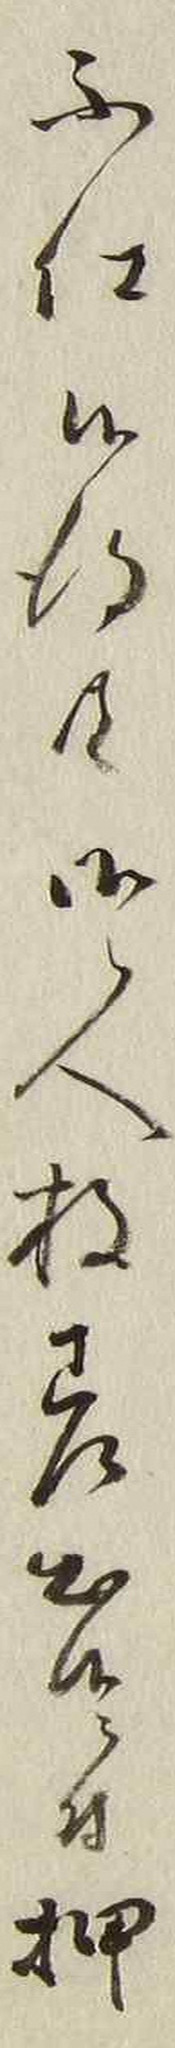不仕候得共御人枚差出候に付押
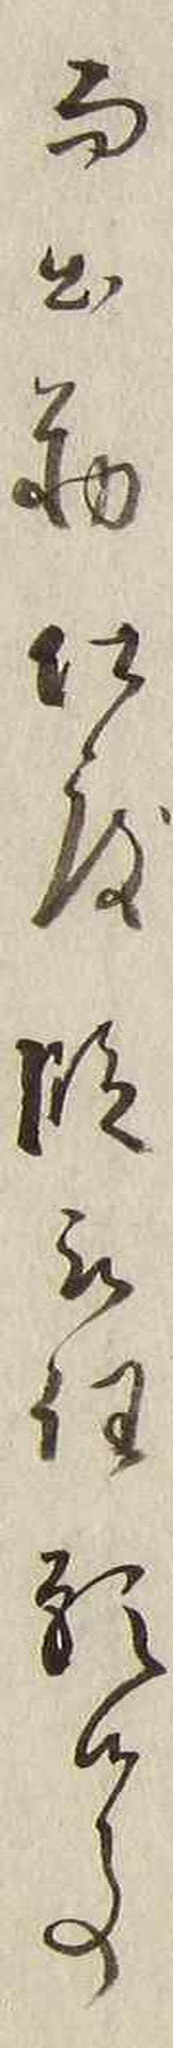而出勤仕度段被任願候事

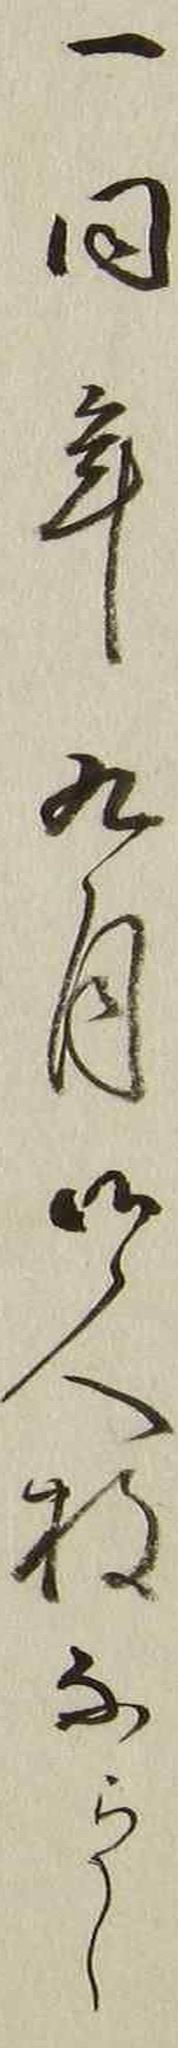一同年九月御人枚ならし
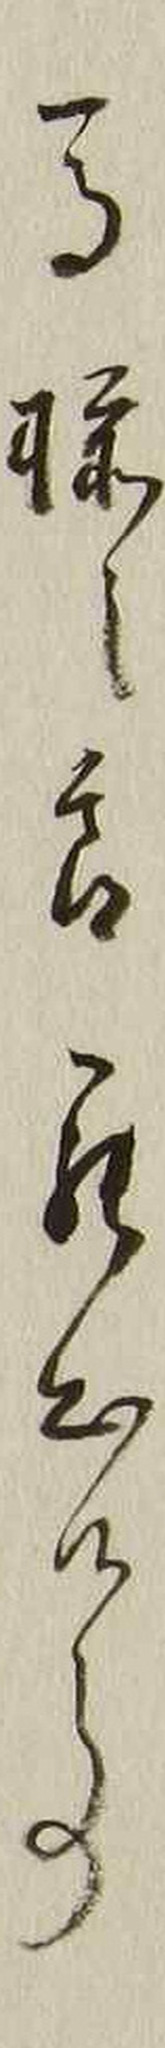馬様之節罷出候事
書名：諸士系譜　巻之159　な之部1
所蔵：会津若松市立会津図書館
